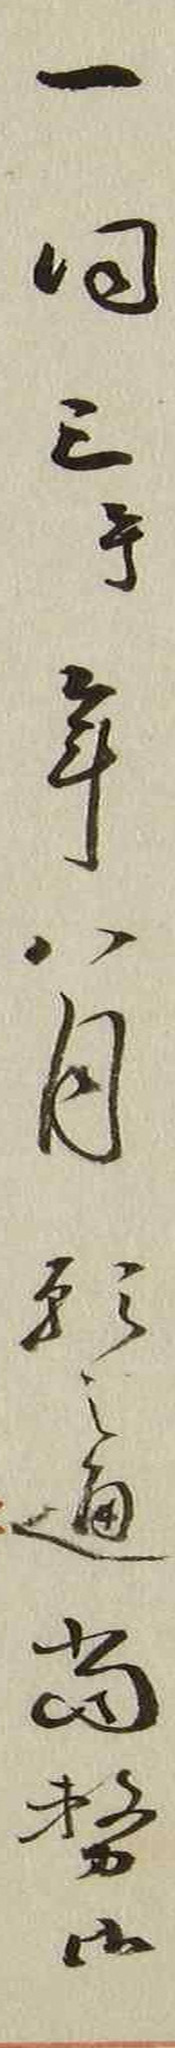一同三午年八月願之通当務御
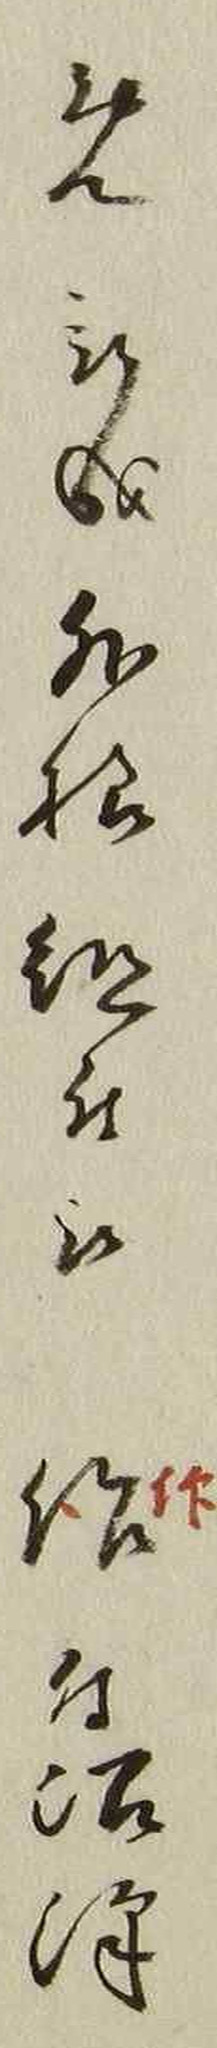免被成外様組付被仰付沼澤
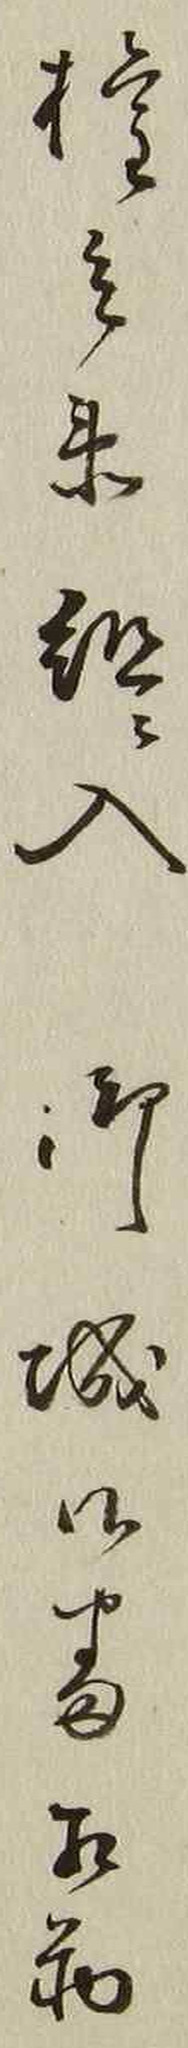権兵衛組に入御城御番相勤
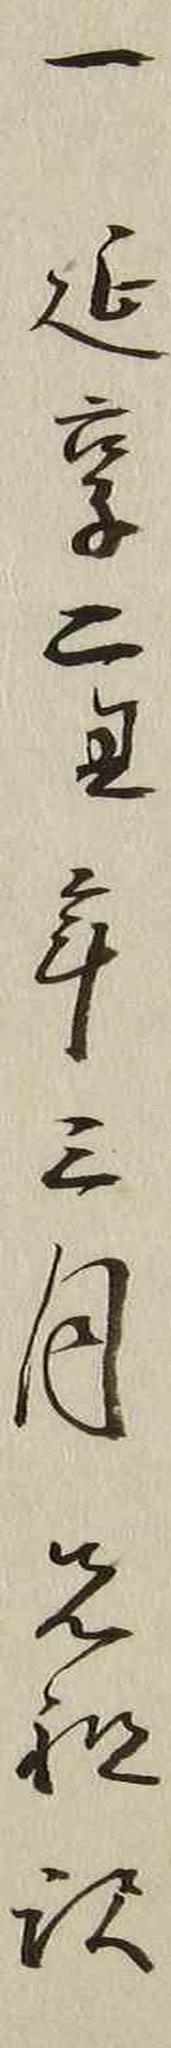一延享二丑年三月先祖訳
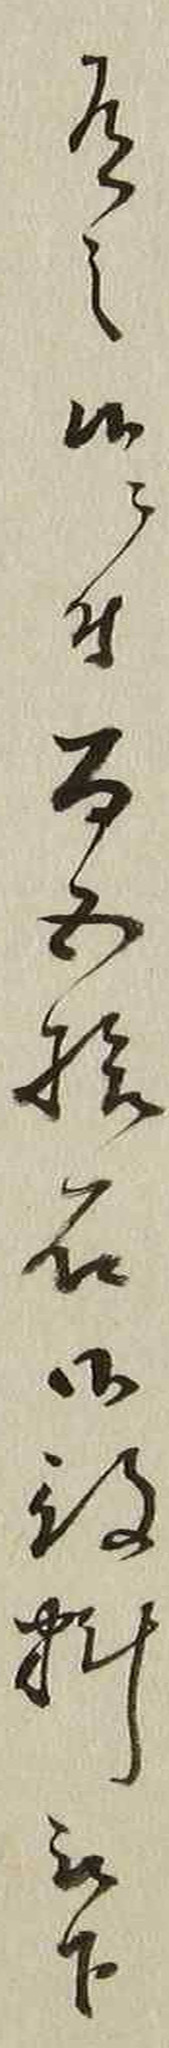有之候に付百五拾石御役料被下
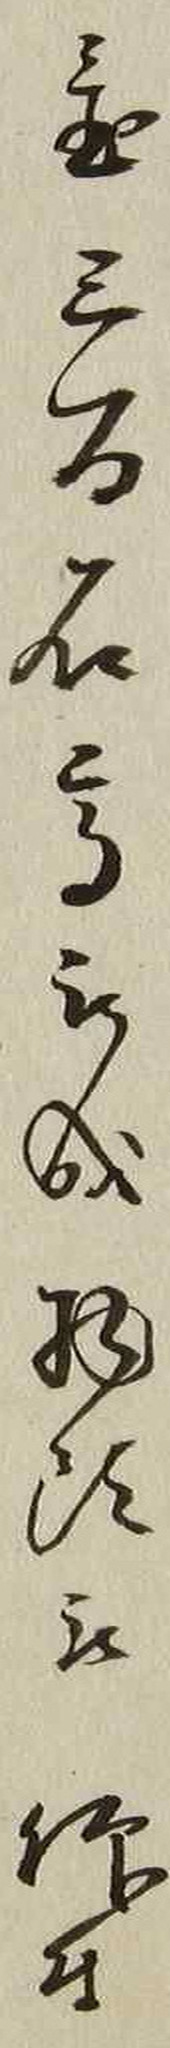置三百石高被成物頭被仰付
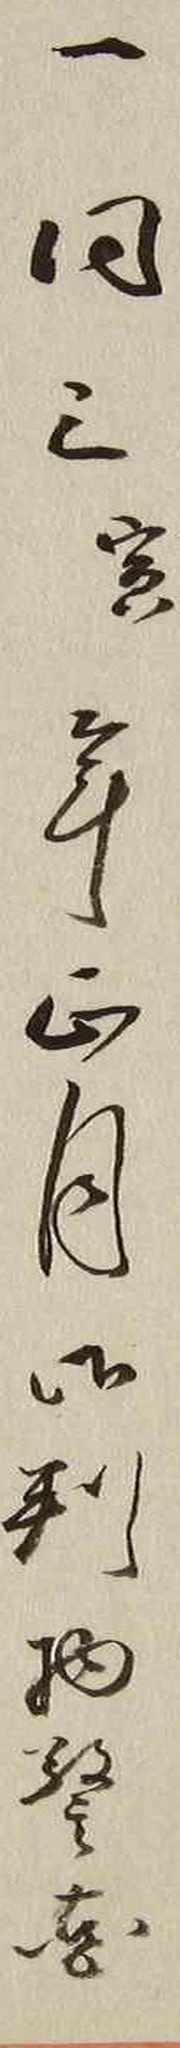一同三寅年正月御判物警固
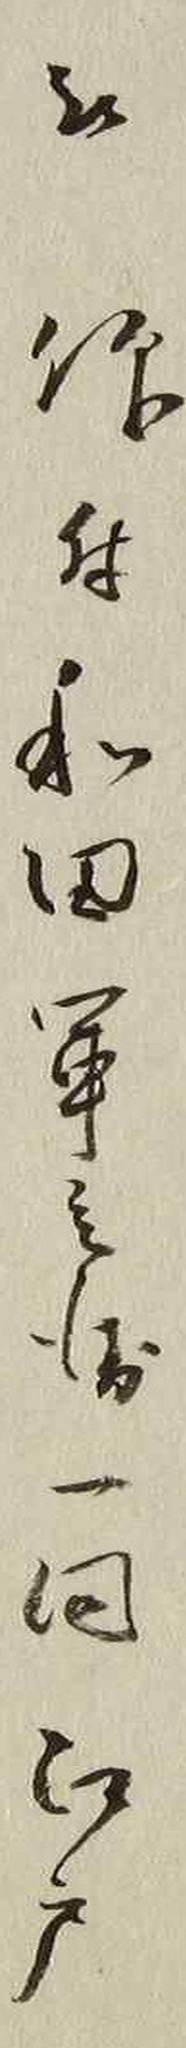被仰付和田軍兵衛一同江戸
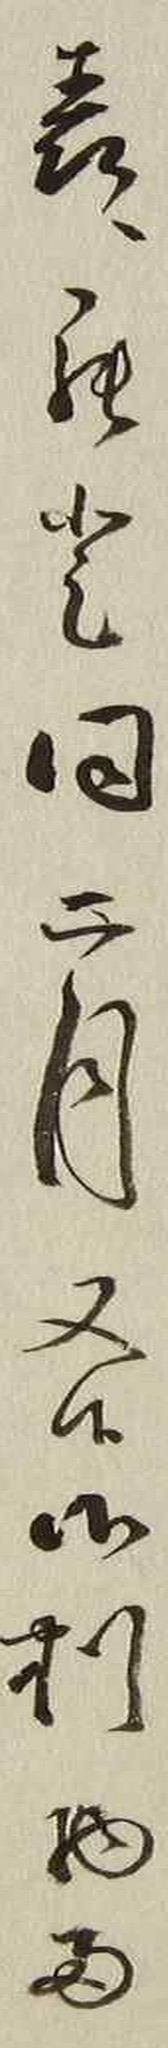表へ罷登同二月又候御判物両
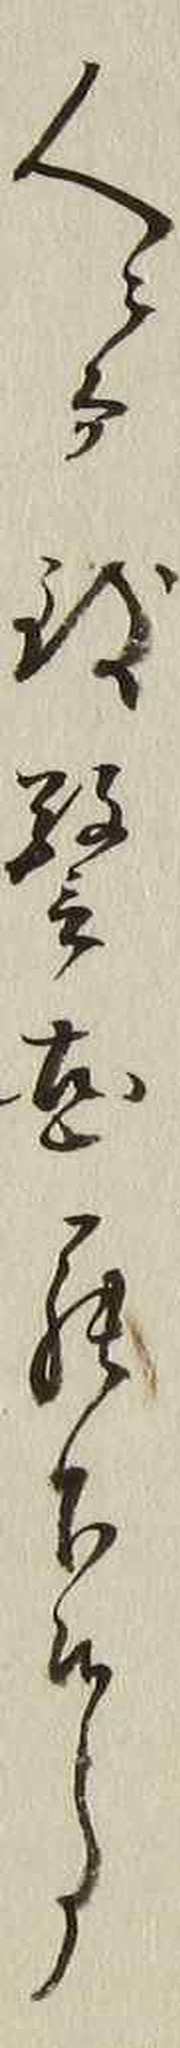人に而致警固罷下候事
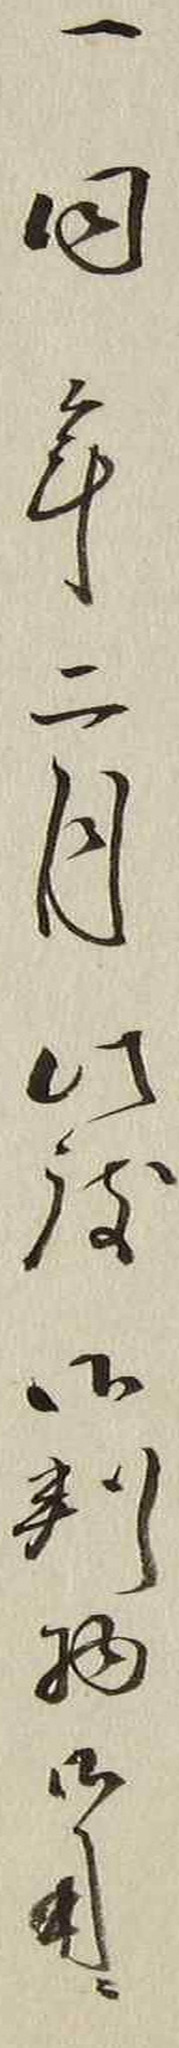一同年二月此度御判物御用に
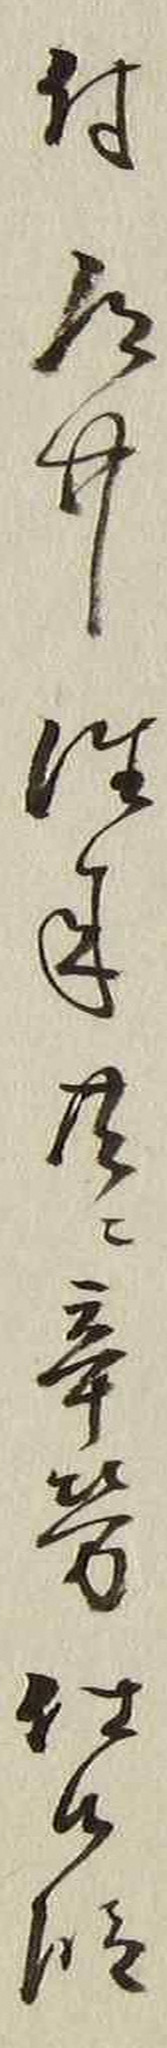付道中往来共ニ辛労仕候段
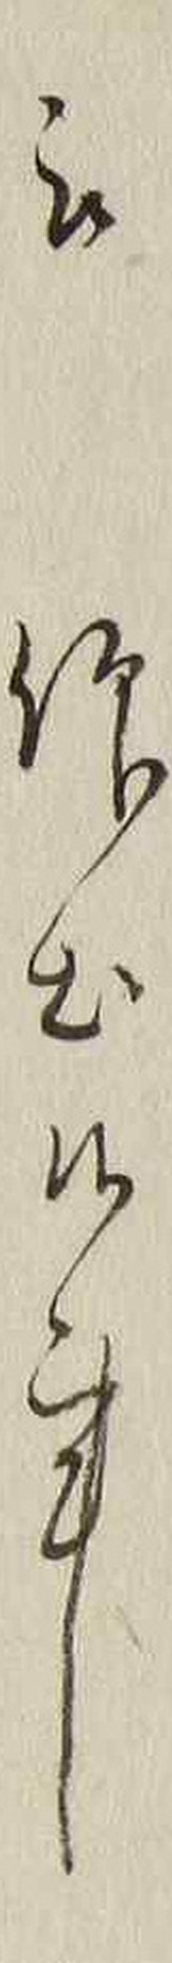被仰出候事
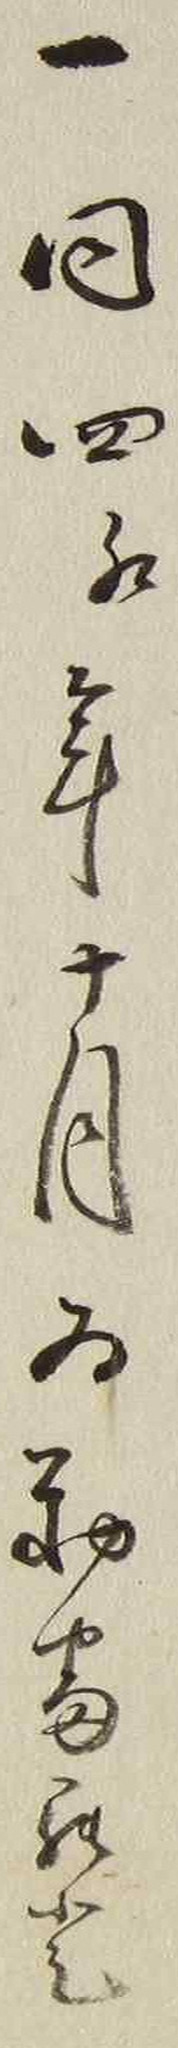一同四卯年十月為勤番罷登
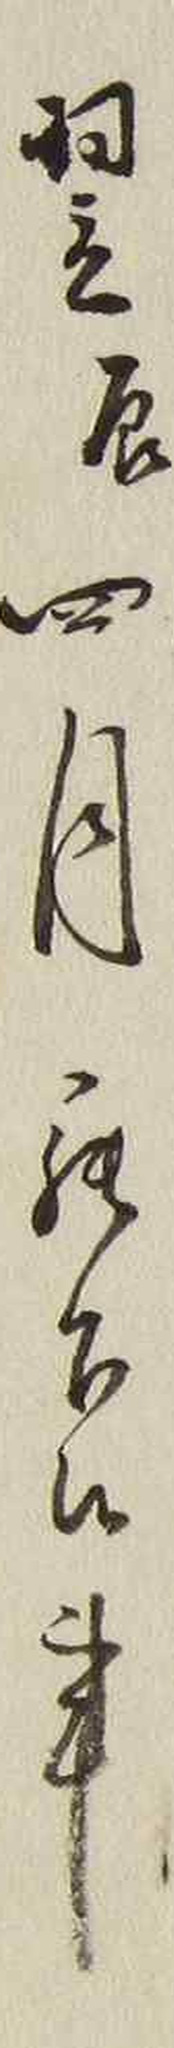翌辰四月罷下候事
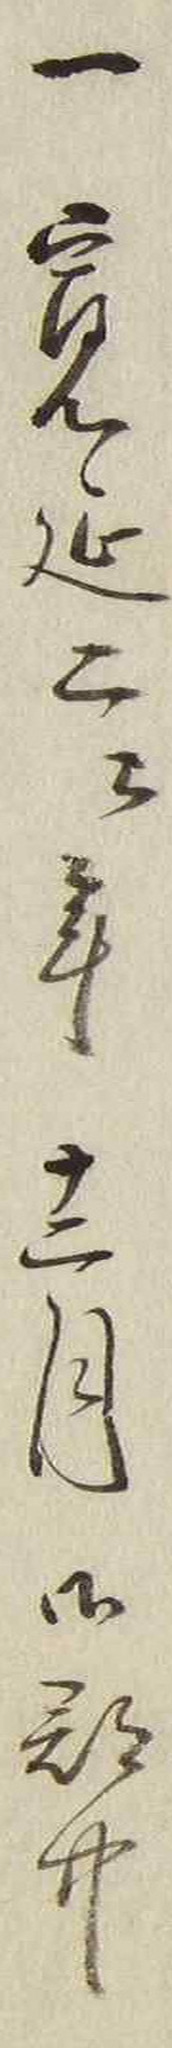一寛延二巳年十二月御郡中
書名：諸士系譜　巻之159　な之部1
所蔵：会津若松市立会津図書館
